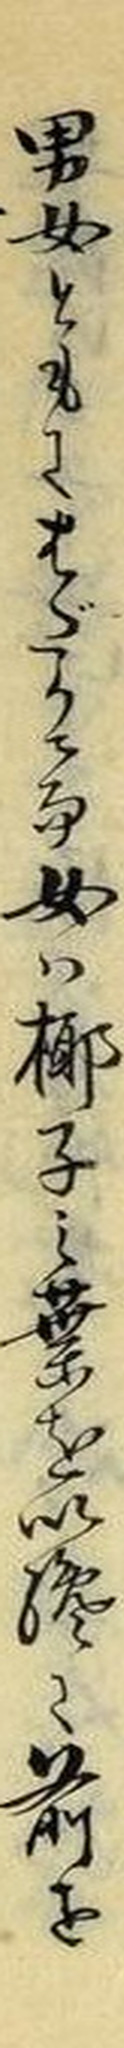男女ともにはだかニ而女ハ椰子之葉を以纔に前を
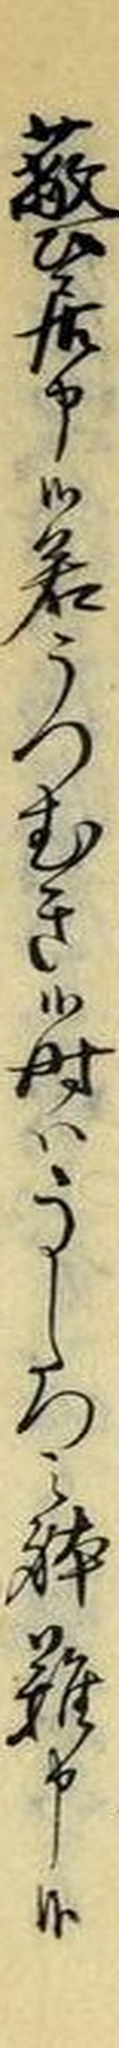蔽ひ居申候若うつむき候時ハうしろ之躰難申候
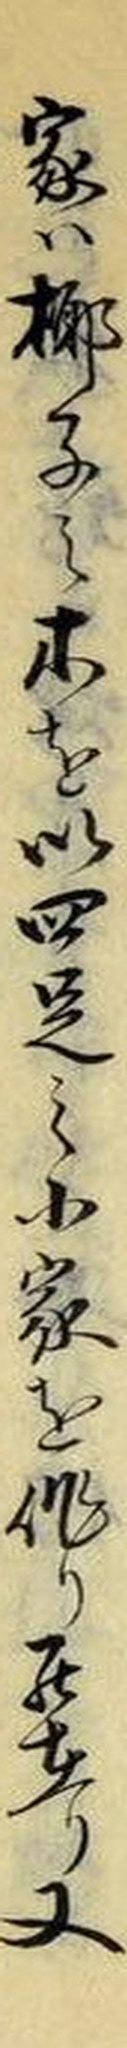家ハ椰子之木を以四足之小家を作り罷在り又
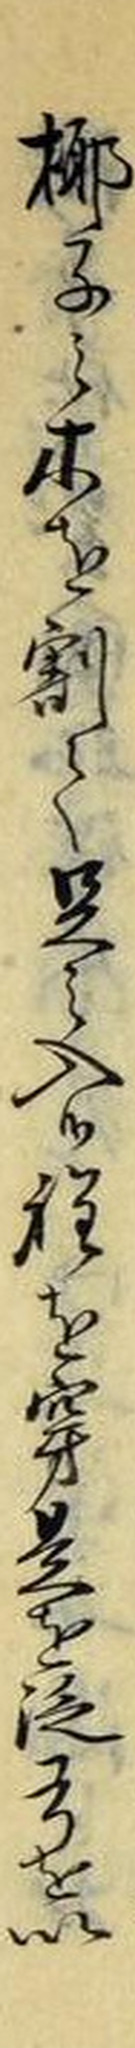椰子之木を割て足之入候程を穿是を泛弓を以

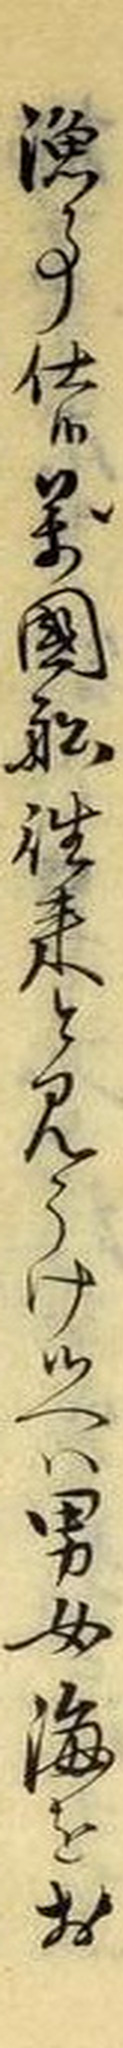漁事仕候万国船往来と見うけ候へハ男女海をお
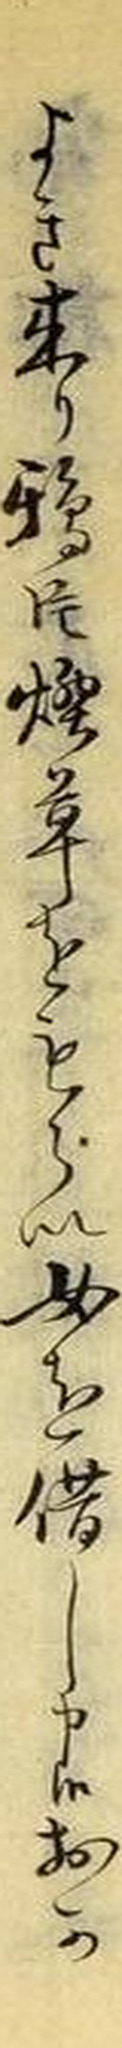よき来り鴉片煙草をもらい女を借し申候おか
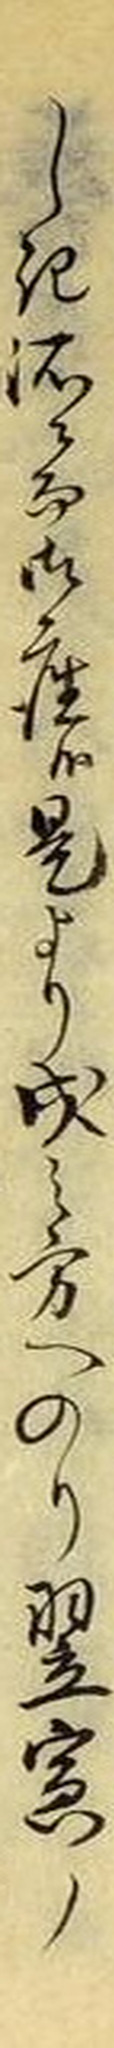しき所ニ而御座候是より戊之方へのり翌寅ノ
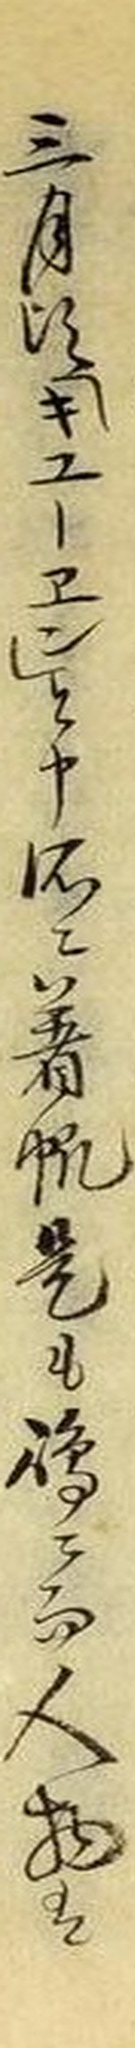三月頃「キユーエン」と申所ニ着帆是も島ニ而人物は
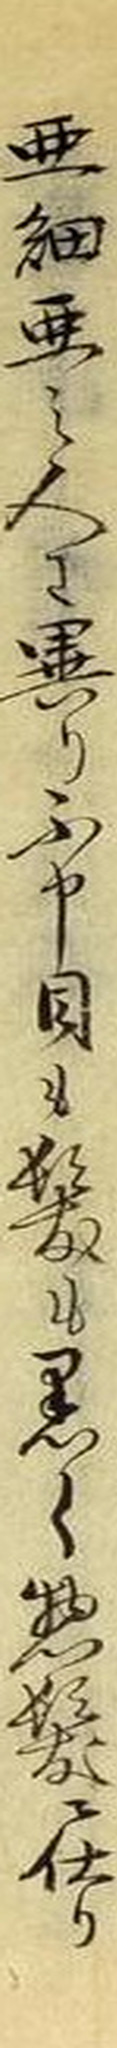亜細亜之人に異り不申目も髪も黒く惣髪ニ仕り
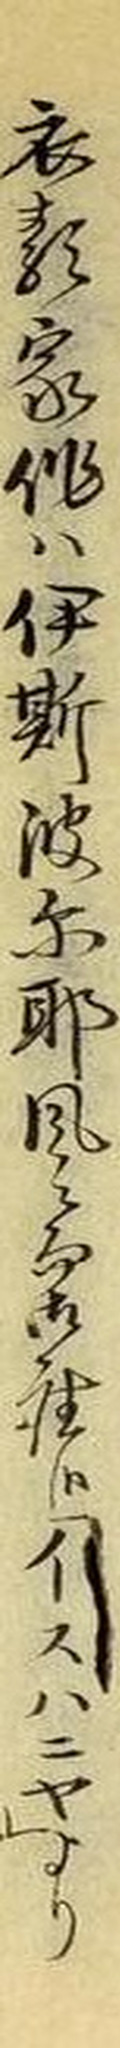衣類家作ハ伊斯波尓耶風ニ而御座候「イスハニヤ」より
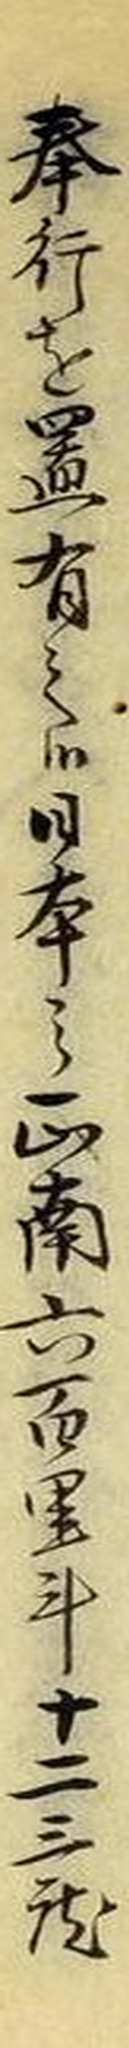奉行を置有之候日本之正南六百里計十二三度
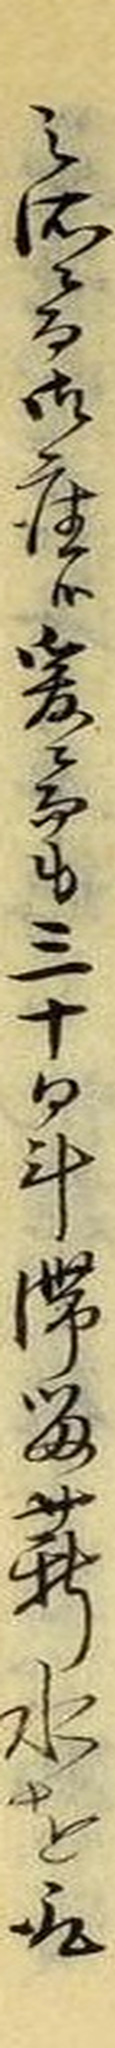之所二而御座候爰ニ而も三十日計滞留薪水を取
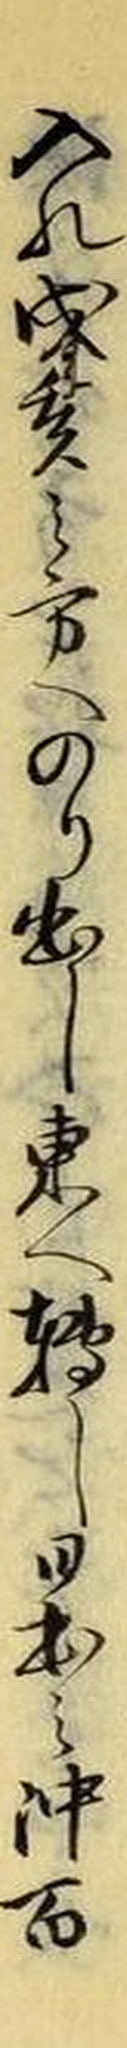入れ戊亥之方へのり出し東へ転し二本の沖百
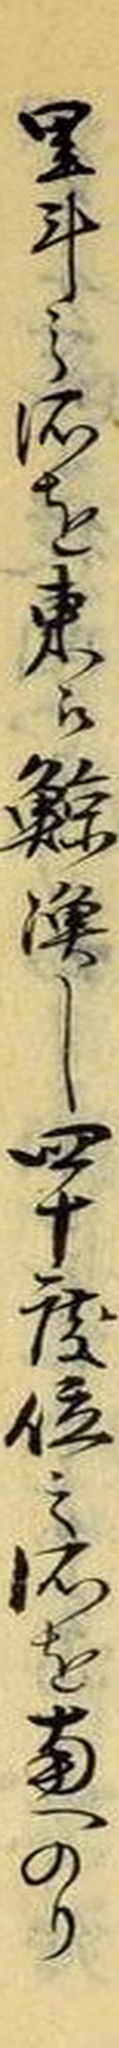里計之所を東へ鯨漁し四十度位之所を南へのり
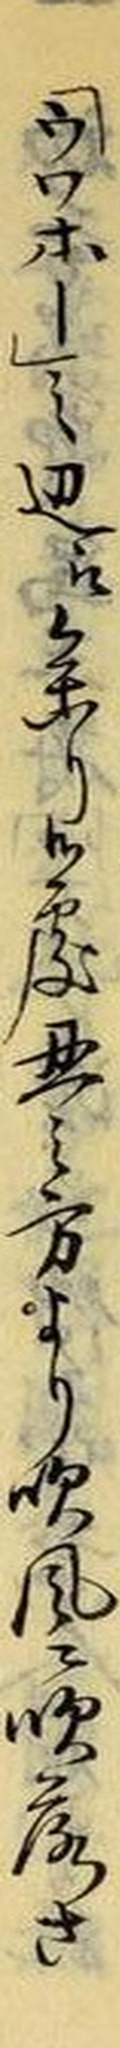「ウワホー」之辺へ参り候處丑之方より吹風ニ吹落さ
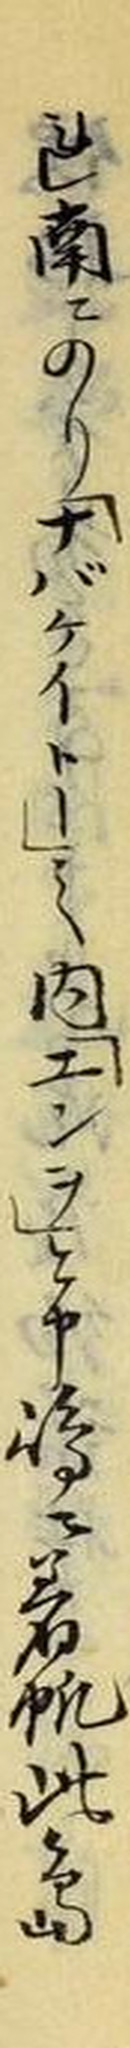れ南ニのり「ナバケイトー」之内「エンヲ」と申島ニ着帆此島
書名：漂客談奇（備考雑録写8）
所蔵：福井県文書館 Fukui Prefectural Archives
